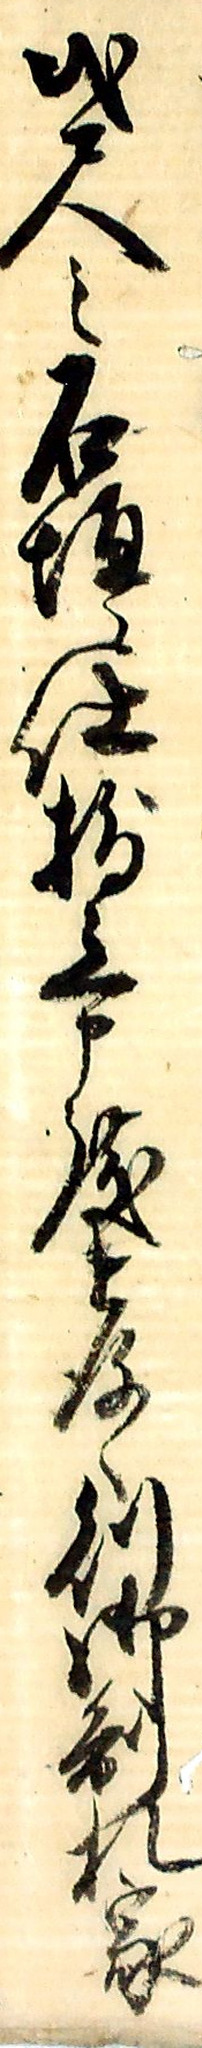弐尺之石垣に仕指上申度奉存候則御制札家
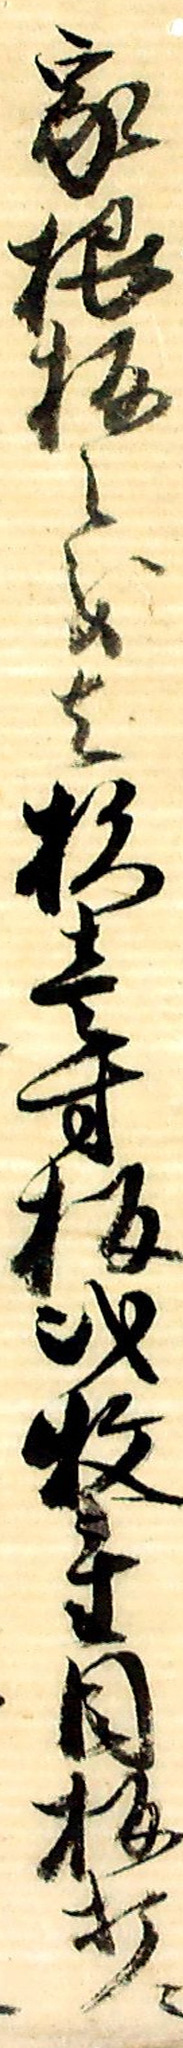屋根板之義は杉壱寸板弐枚重目板打に
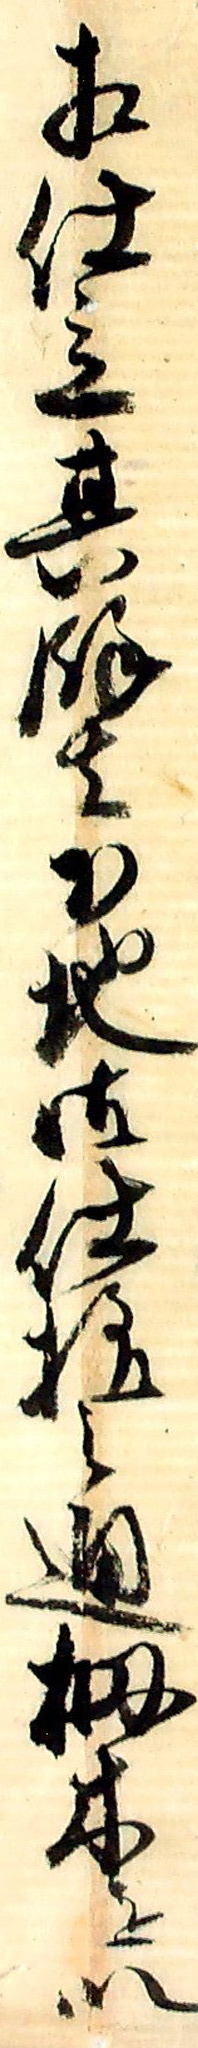相仕立其余は下地御仕様之通栂木を以
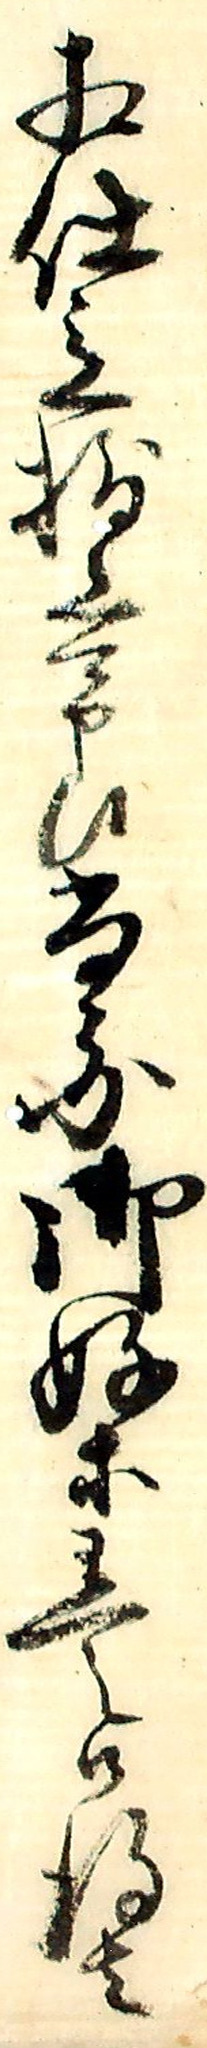相仕立指上可申候尚亦御好等有之候得は
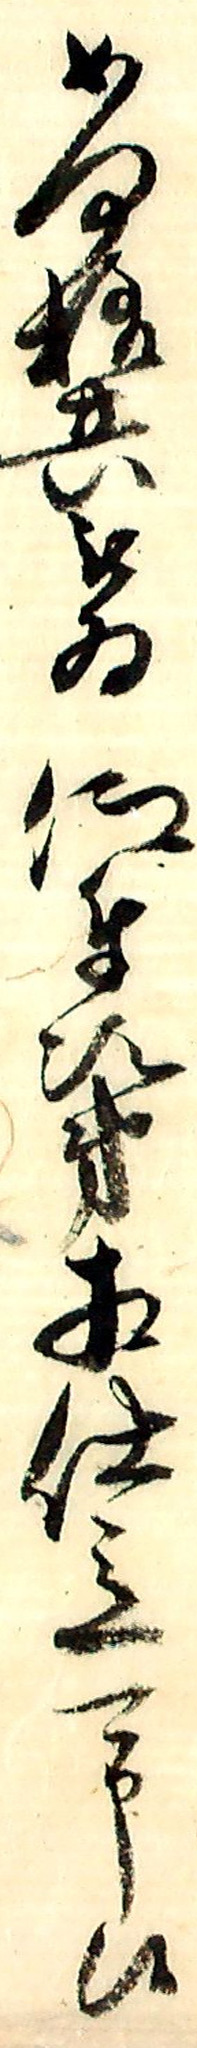如何様共被為仰付次第相仕立可申候
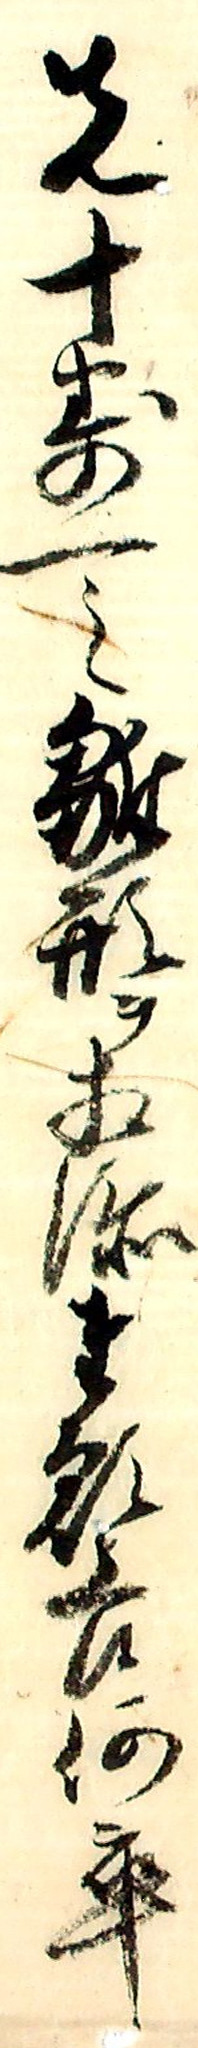先十歩一之雛形を相添奉願上候何卒
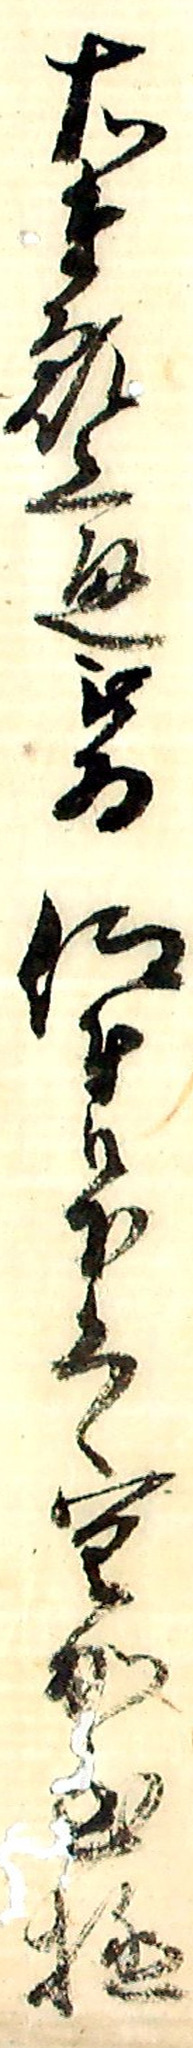右奉願上通被為仰付被下候はゝ冥加至極
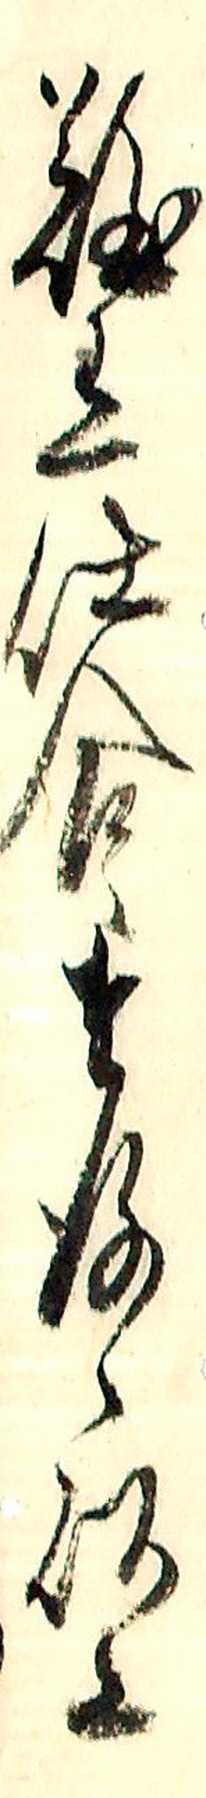難有仕合に奉存候以上
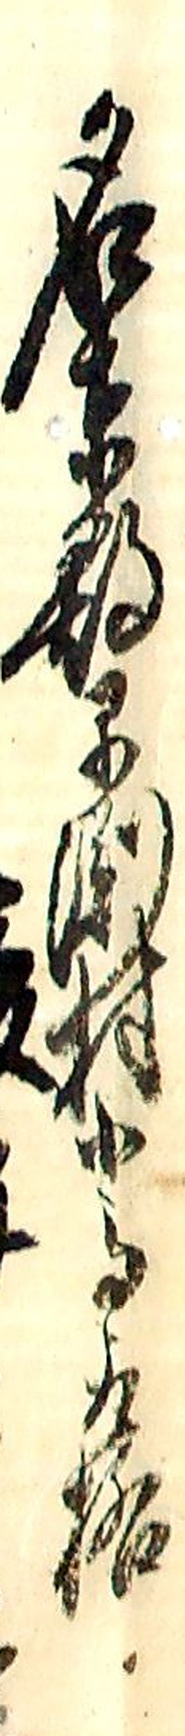名東郡早淵村小高取格
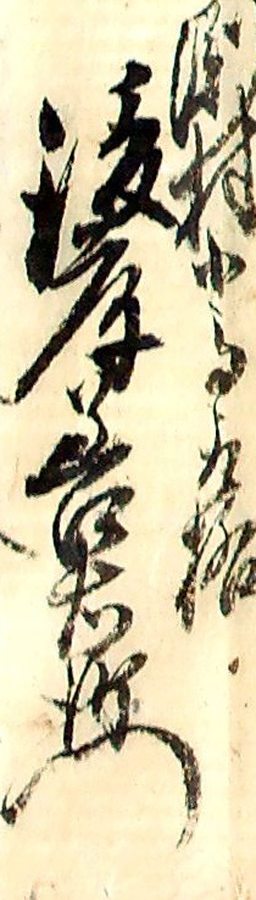後藤善右衛門

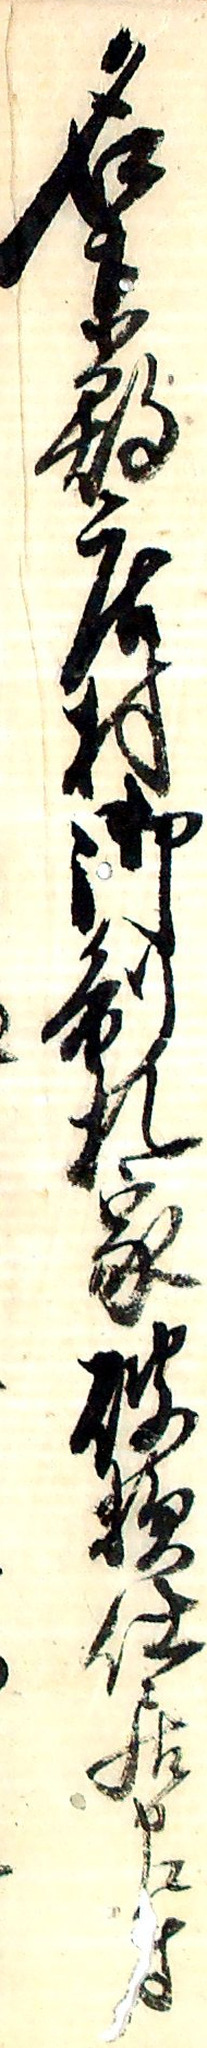名東郡庄村御制札家破損仕居申に付
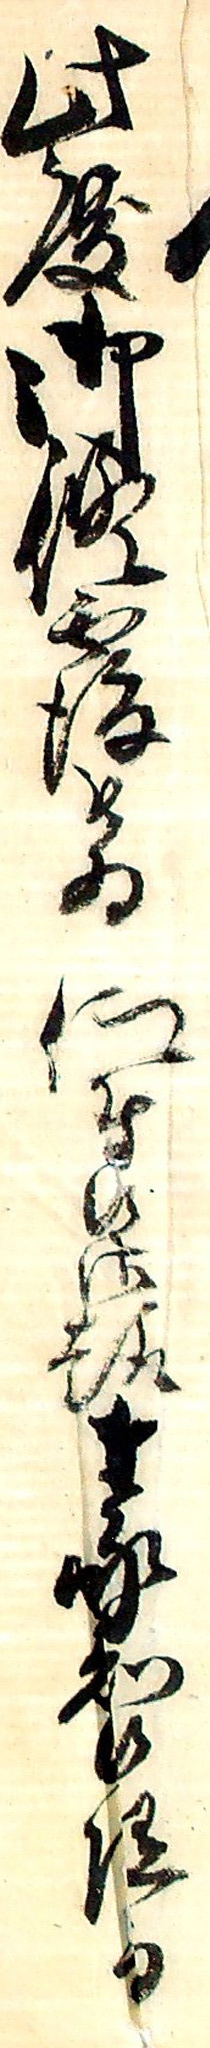此度御修覆被為仰付候御趣奉承知候随て
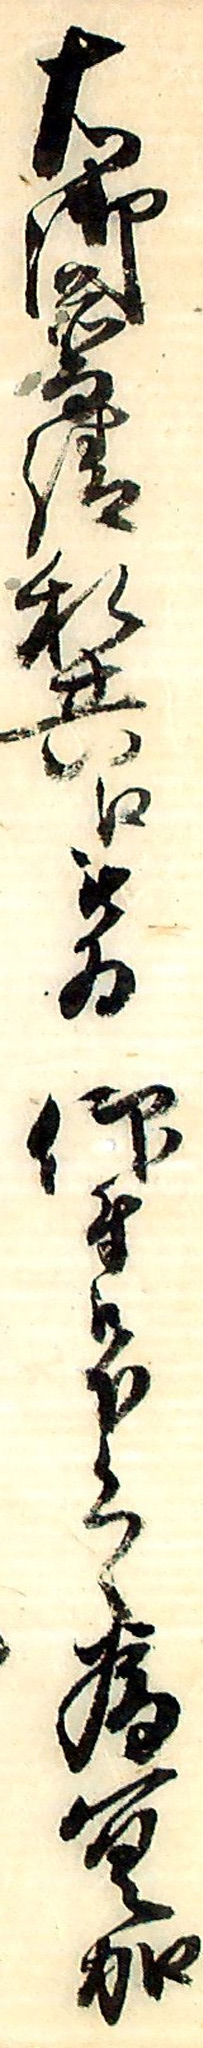右御普請私共え被為仰付被下候はゝ為冥加
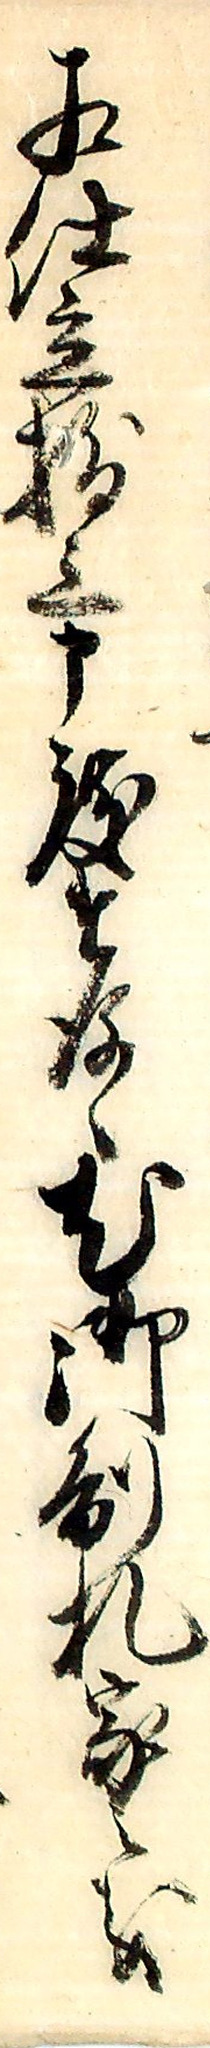相仕立指上申度奉存候尤御制札家之義
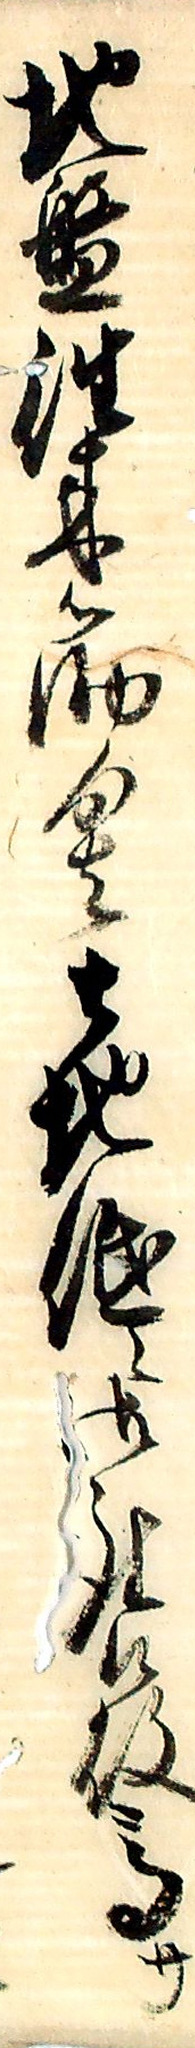地盤往来筋ゟは土地低に御座候故高さ
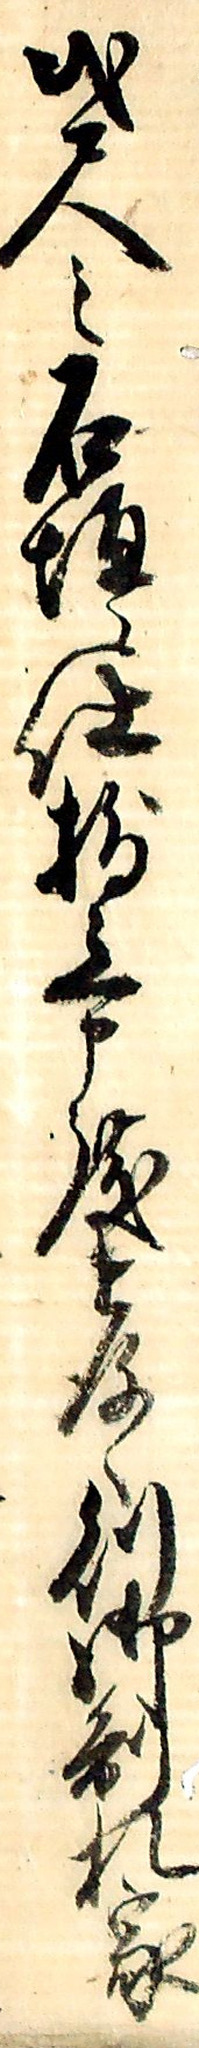弐尺之石垣に仕指上申度奉存候則御制札家
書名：諸御願書控(後藤氏壱番）
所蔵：鳴門教育大学 Naruto University of Education
